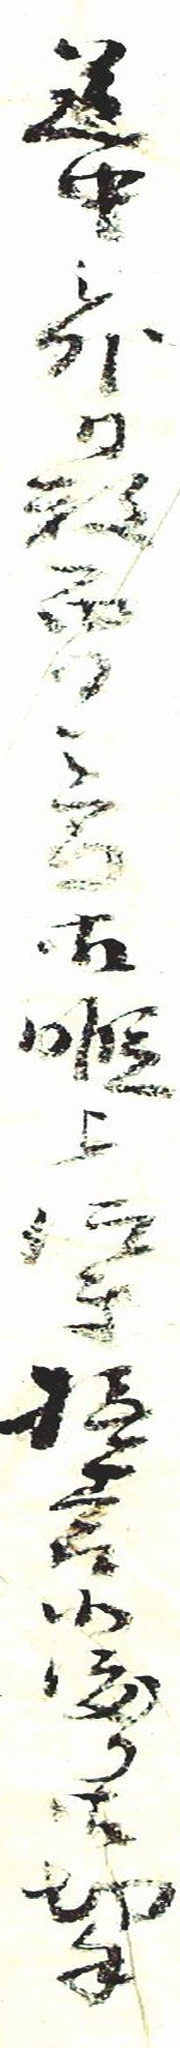道中之外日数届日之間御暇被仰付撫養小渡り御切手
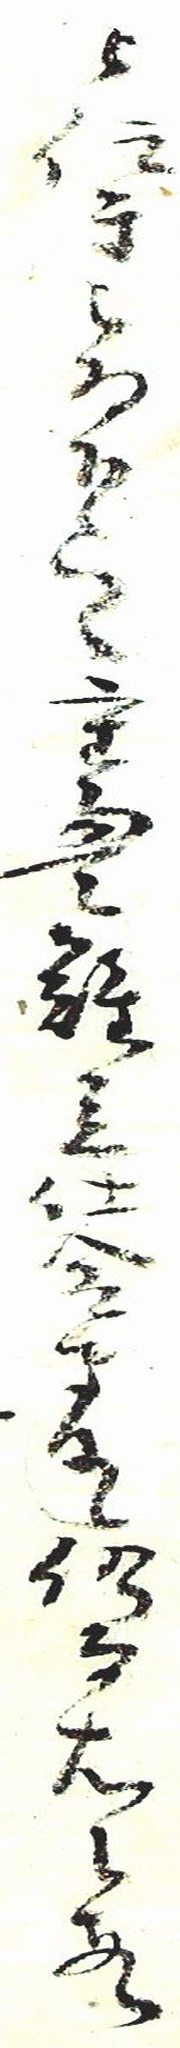被仰付被為下候はゝ重畳難有仕合奉存候仍て右之段
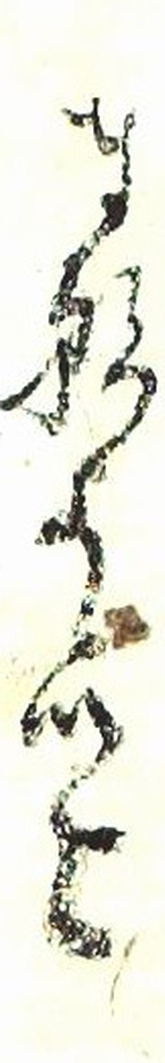奉願上候以上
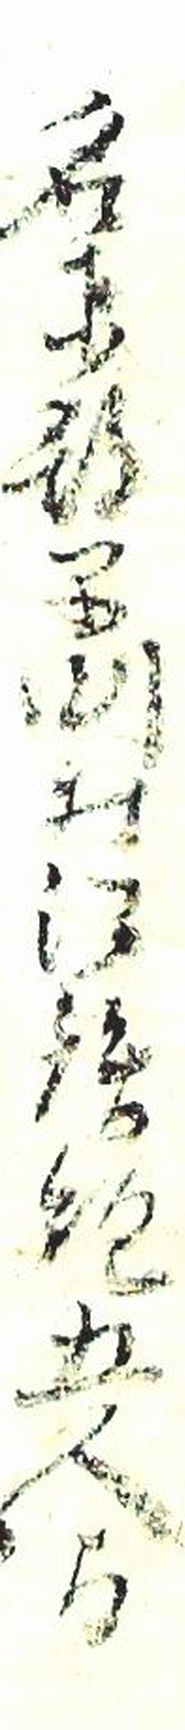名東郡早淵村郷鉄炮五人与
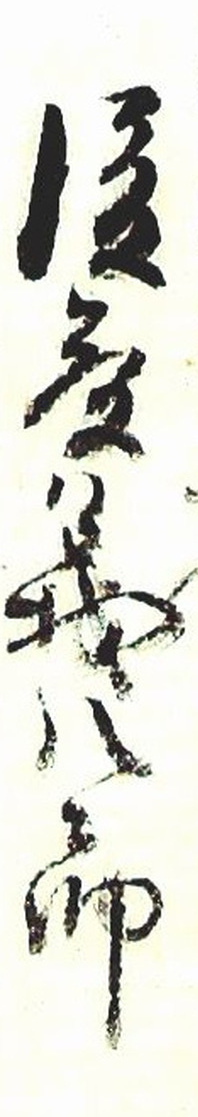後藤義八郎
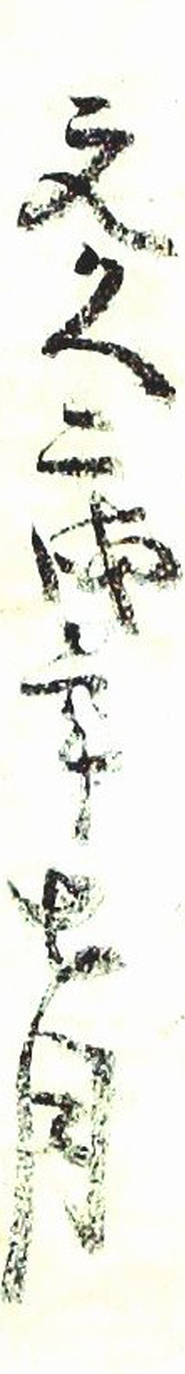文久二戌年七月
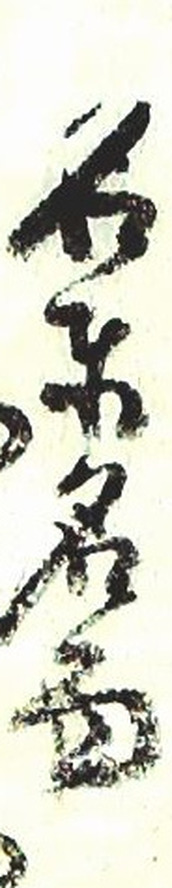名東名西
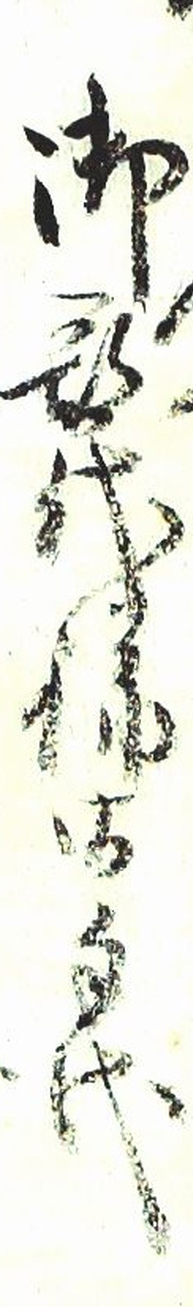御郡代様御手代
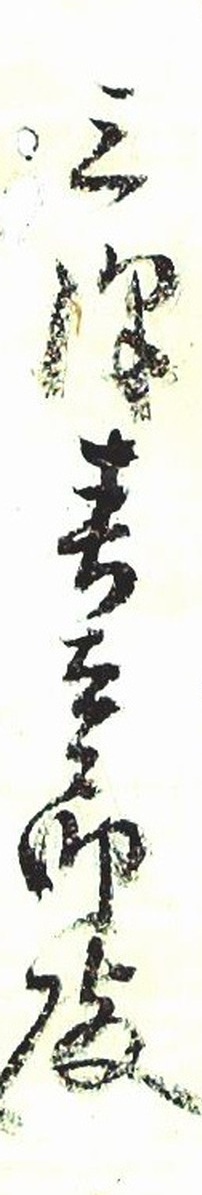三沢春太郎殿
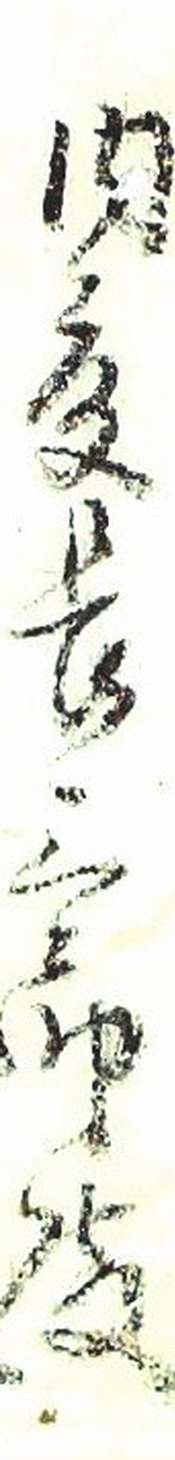内藤長三郎殿
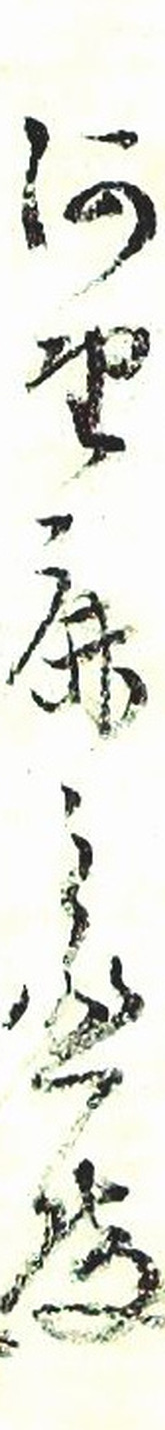河野鹿之丞殿
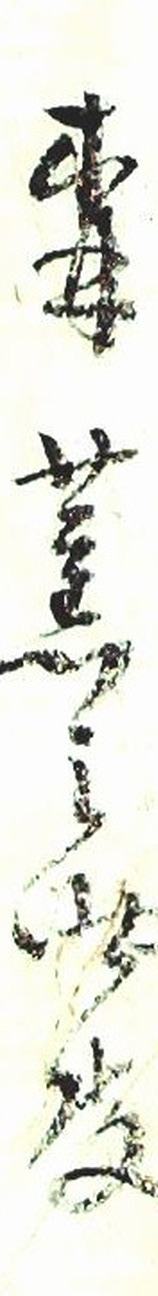森薫之助殿
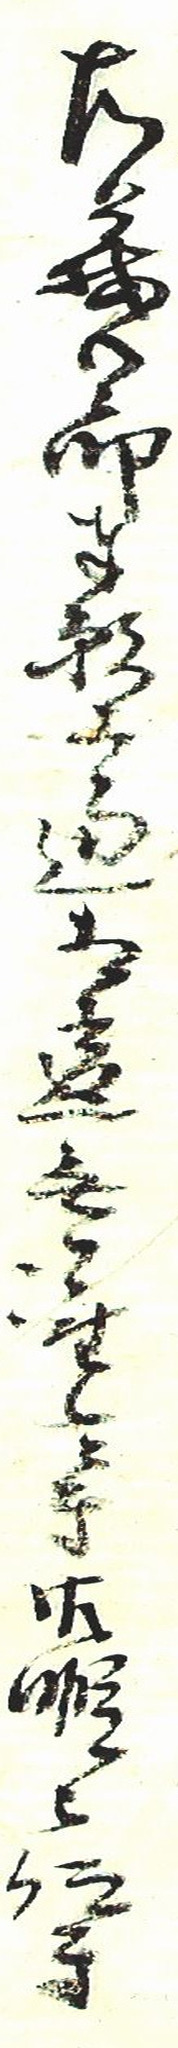右義八郎奉願上通相違無御座候に付御暇被仰付
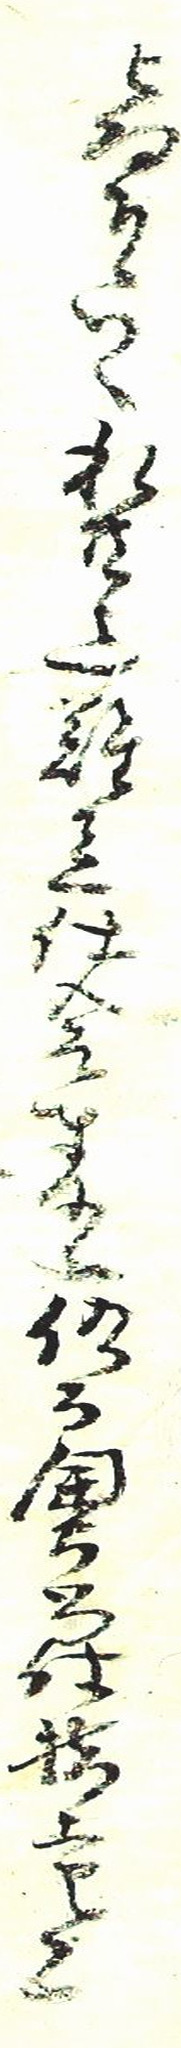被為下候はゝ私共迄難有仕合奉存候仍て奥書仕指上申候以上
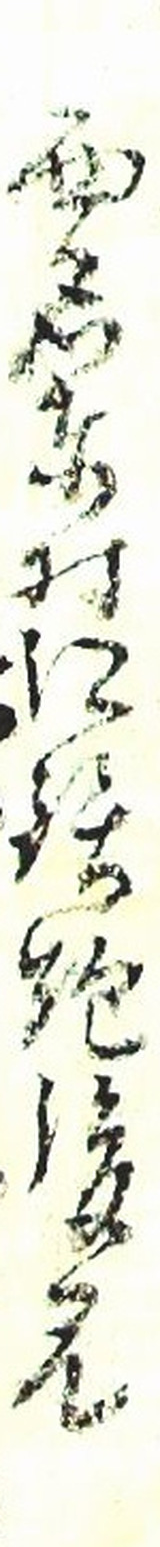西名東村郷鉄炮後見
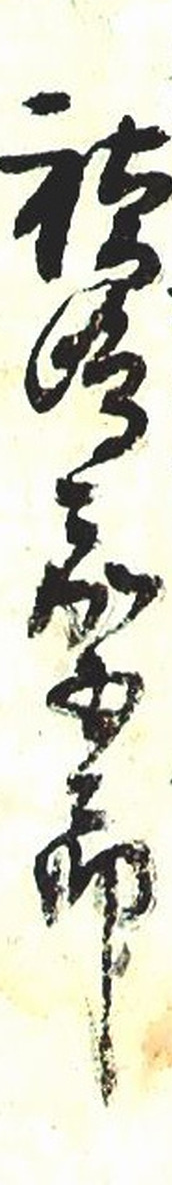禎島嘉五郎
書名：諸御願書控(弐番）
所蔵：鳴門教育大学 Naruto University of Education
